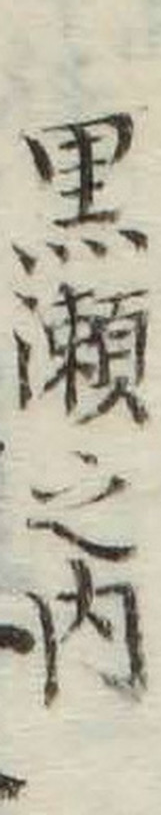黒瀬之内
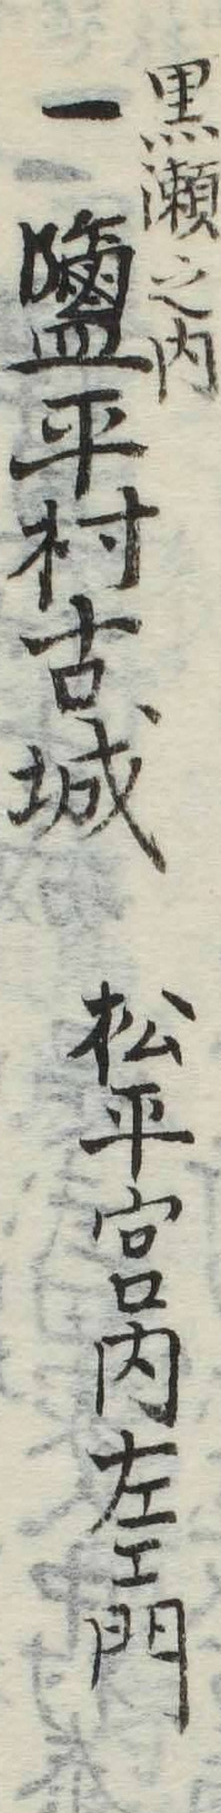一塩平村古城松平宮内左エ門
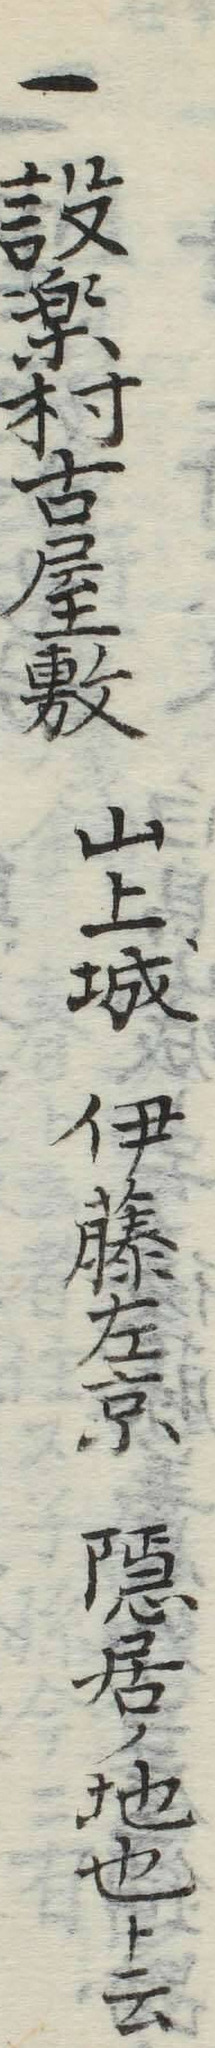一設楽村古屋敷山上城伊藤左京隠居ノ地也ト云
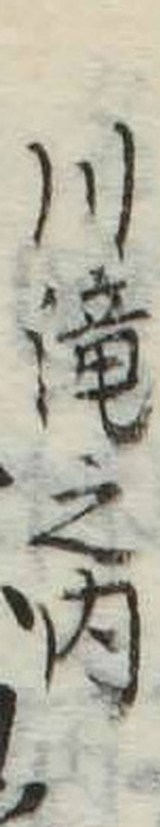川滝之内
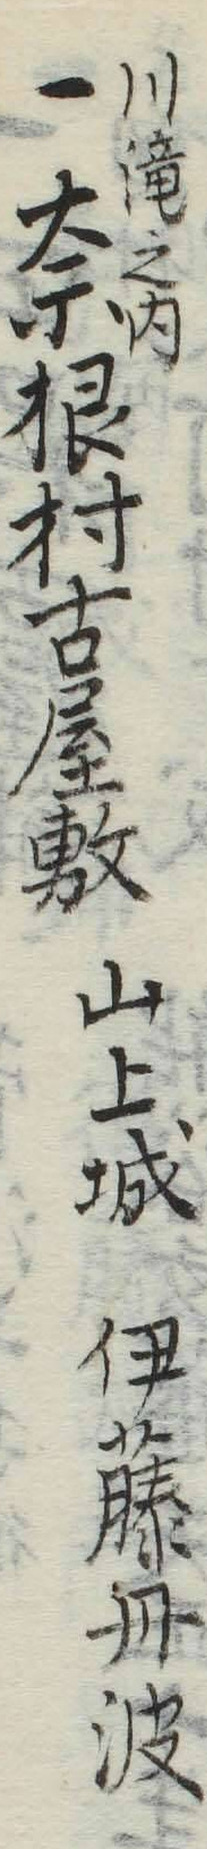一奈根村古屋敷山上城伊藤丹波
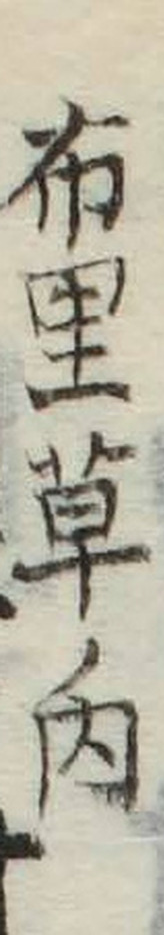布里草ノ内
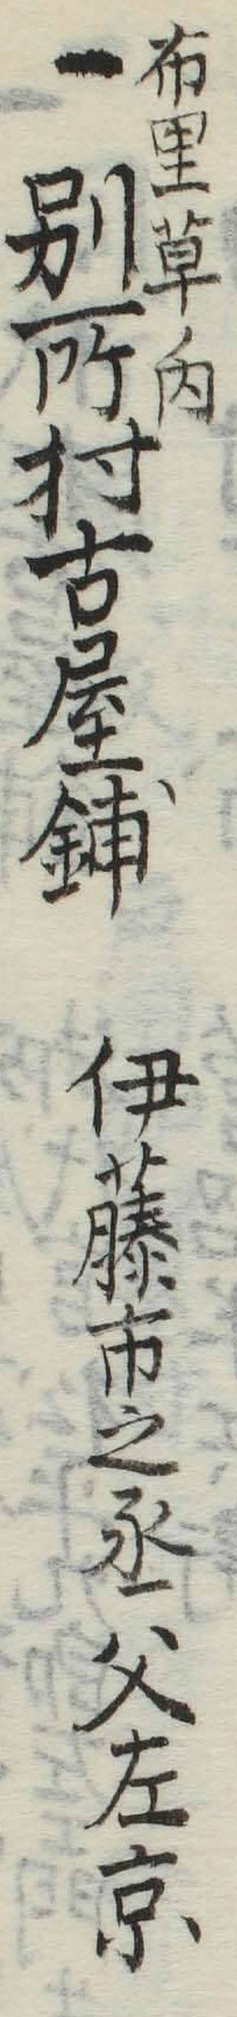一別所村古屋鋪伊藤市之丞父左京
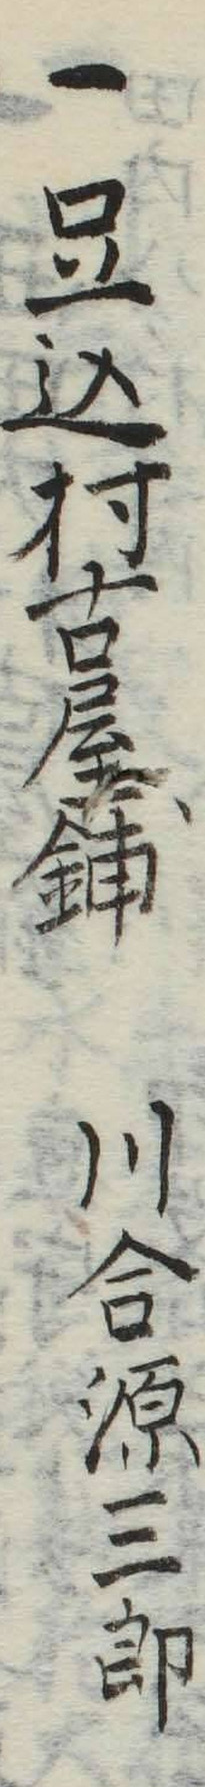一足込村古屋鋪川合源三郎
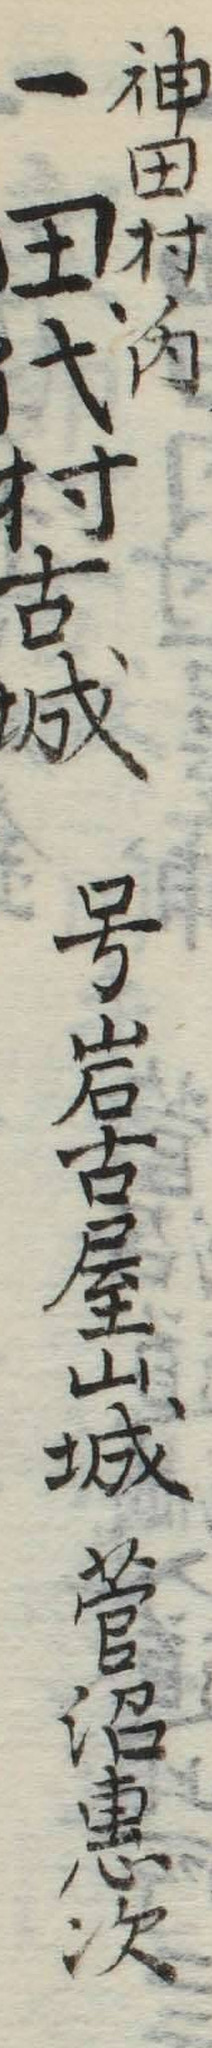一田代村古城号岩古屋山城菅沼恵次

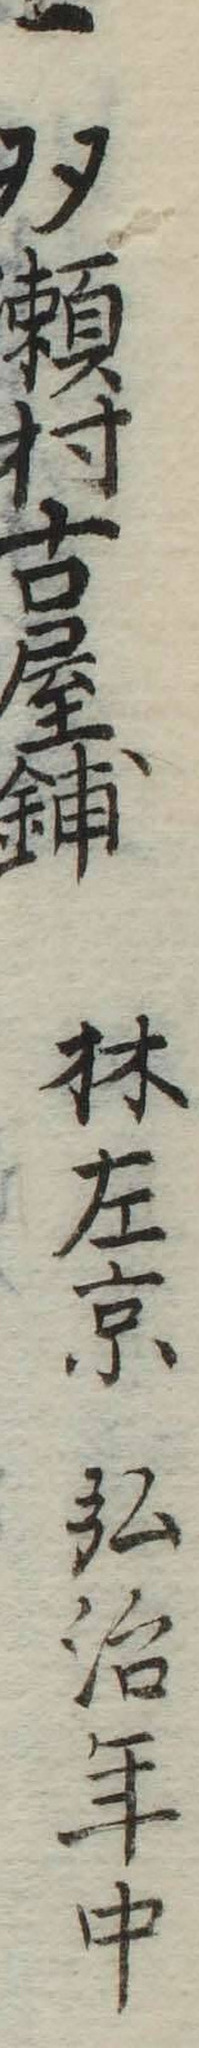一双瀬村古屋鋪林左京弘治年中
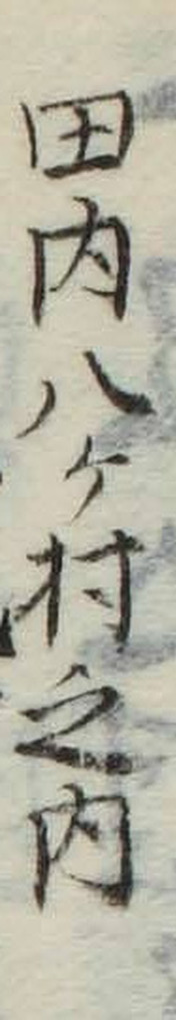田内八ヶ村之内
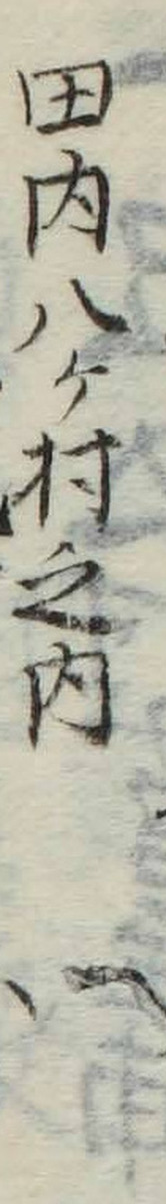田内八ヶ村之内
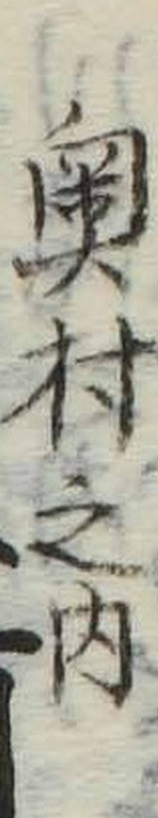奥村之内
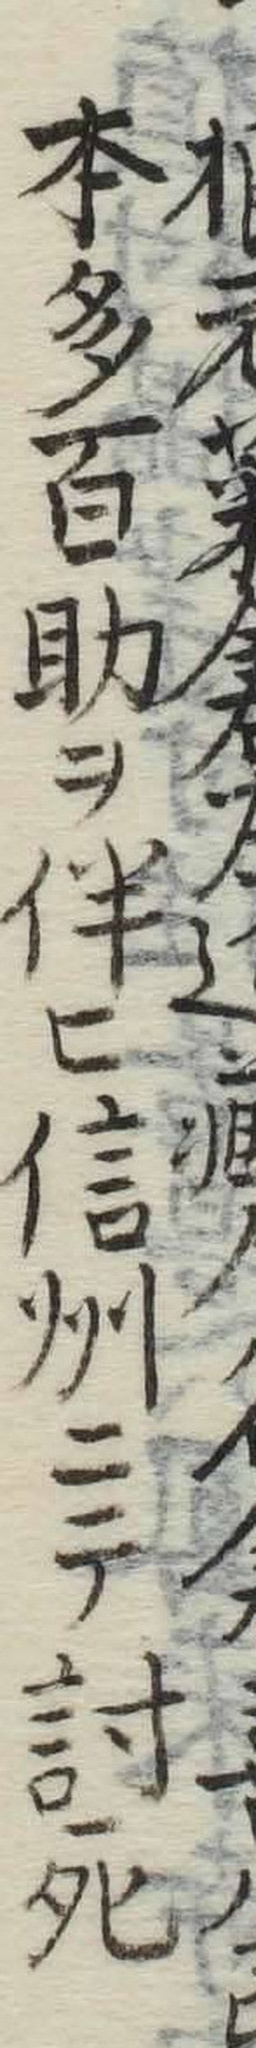本多百助ヲ伴ヒ信州ニテ討死
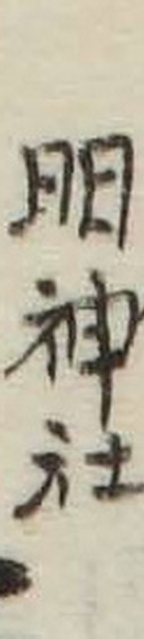明神社
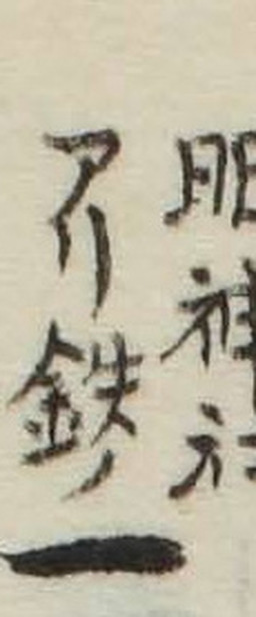アリ鉄ノ
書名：三河国二葉松
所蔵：国文学研究資料館
